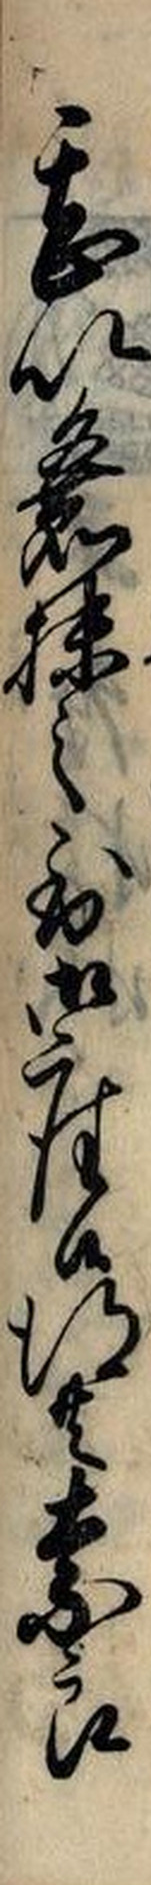甚以麁抹之至御座候得共奈良
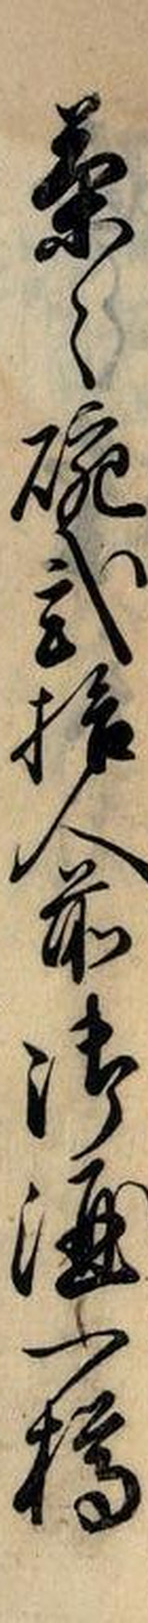茶々碗弐拾人前御酒一樽
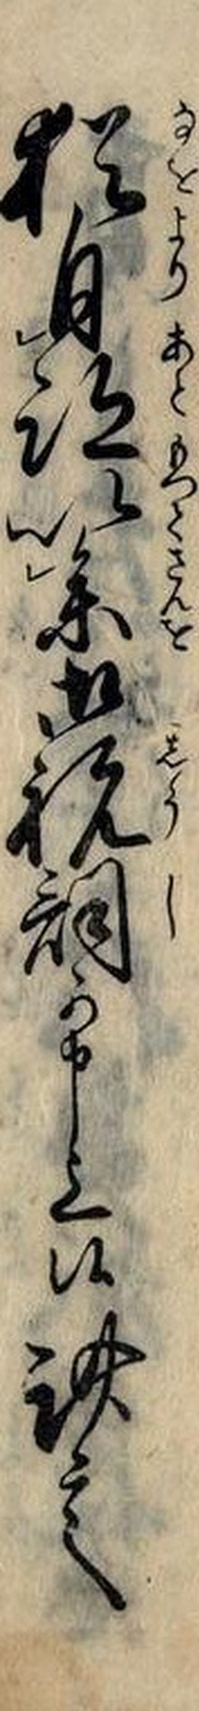猶自跡以参御祝詞可申上候謹言
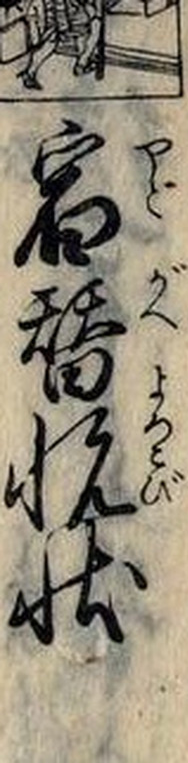宿替悦状
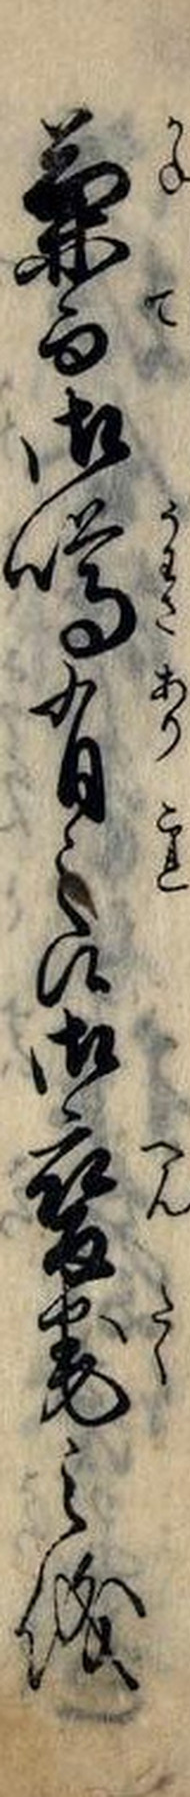兼而御噂有之候御変宅之儀
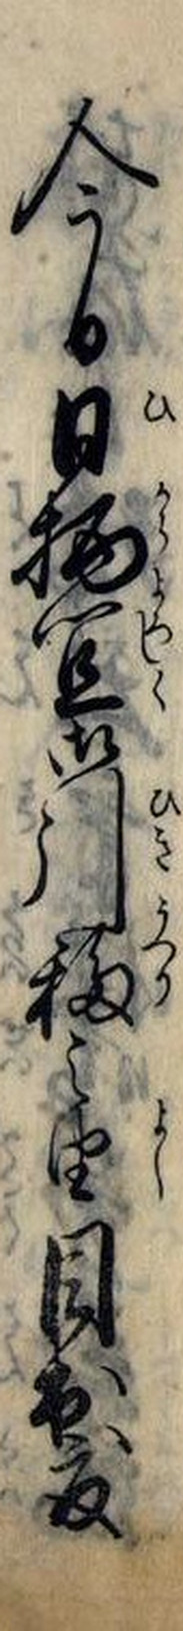今日日柄宜御引移之由目出度

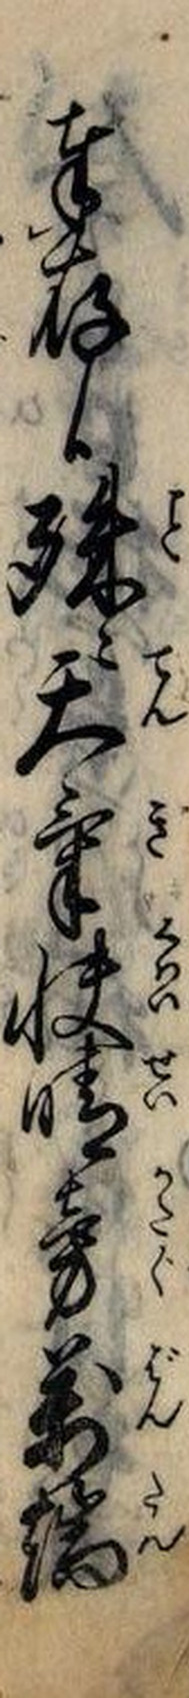奉存候殊に天気快晴旁萬端
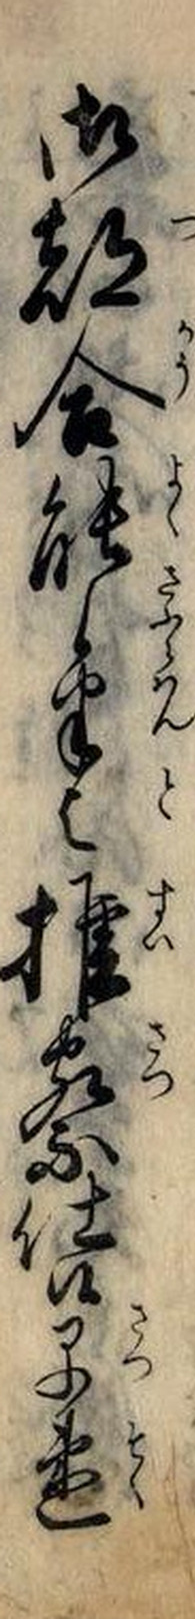御都合能候半与推察仕候早速
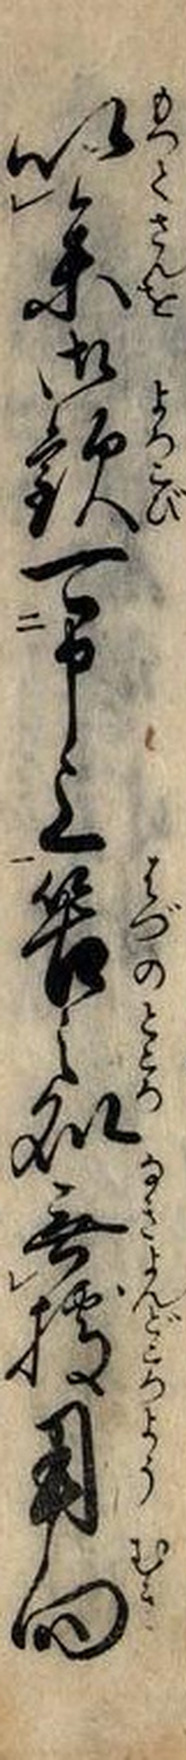以参御歓可申上筈之処無據用向
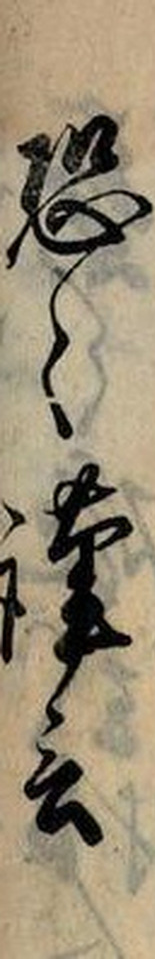恐々謹言
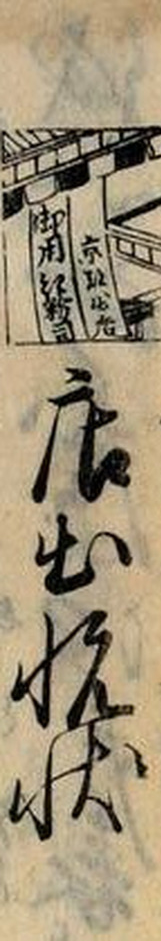店出悦状
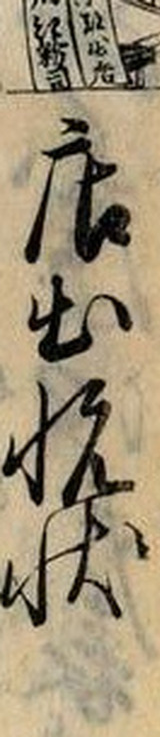店出悦状
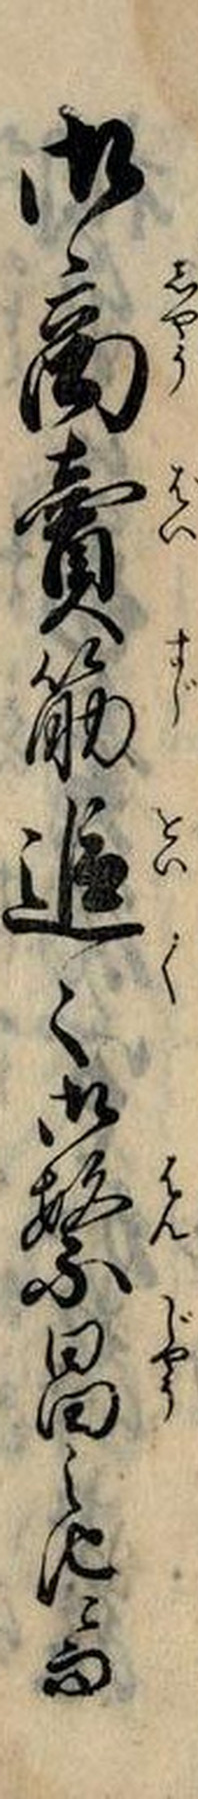御商賣筋追々御繁昌之由に而
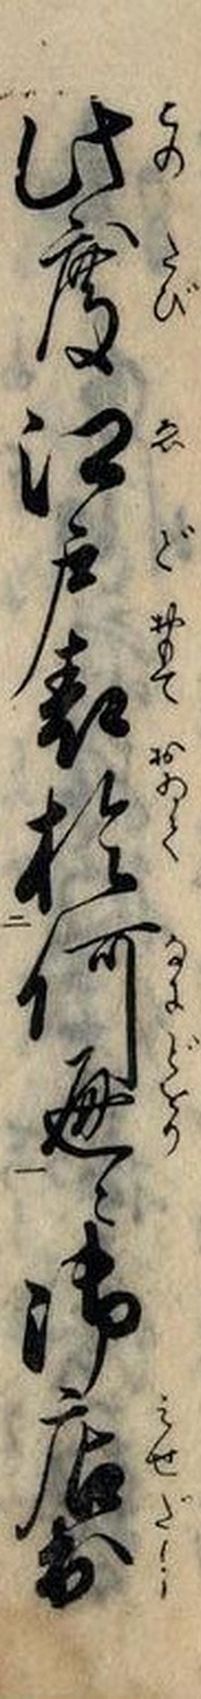此度江戸表於何通に御店出

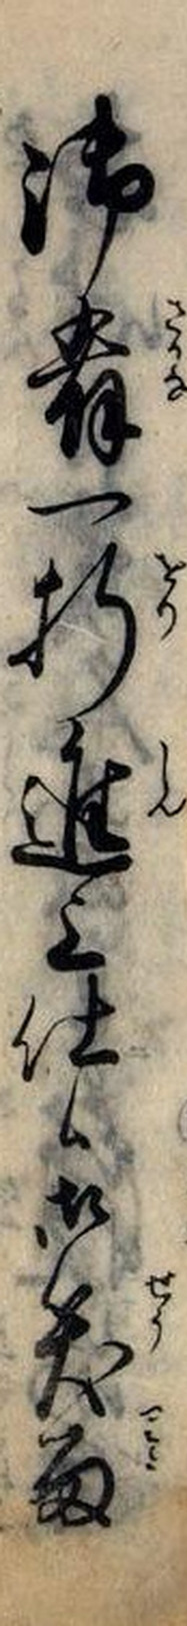御肴一折進上仕候御笑留
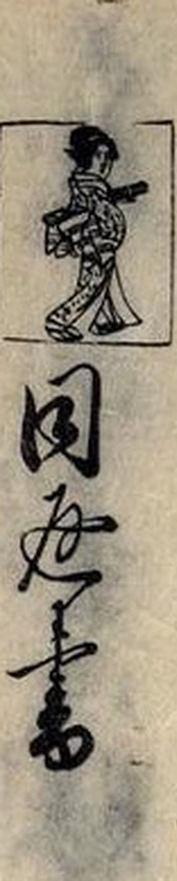同返書
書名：大成用文章（往来物）
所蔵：福井県文書館 Fukui Prefectural Archives
